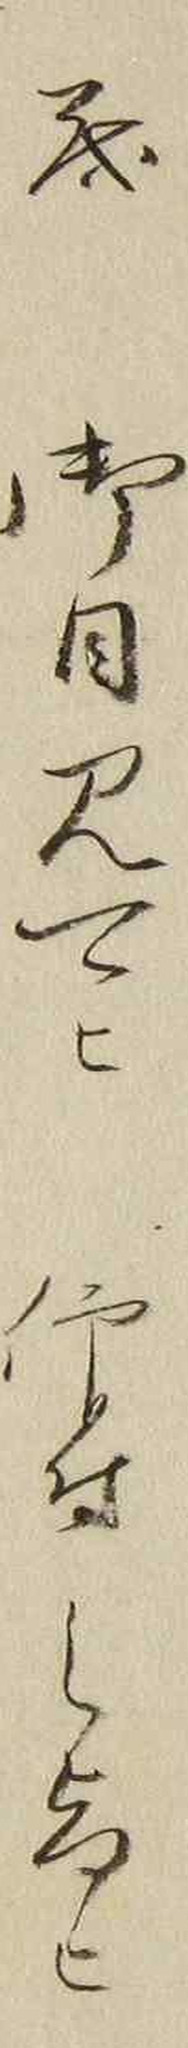も御目見可被仰付之旨被
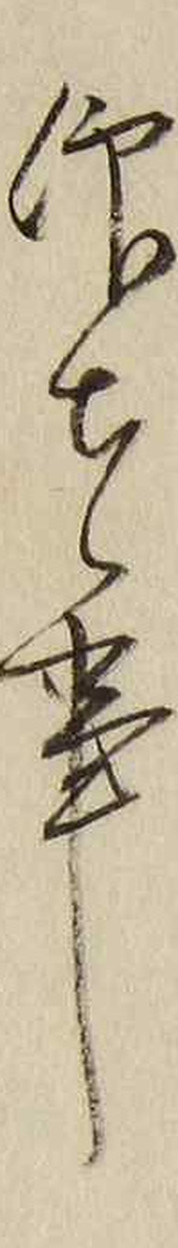仰出候事
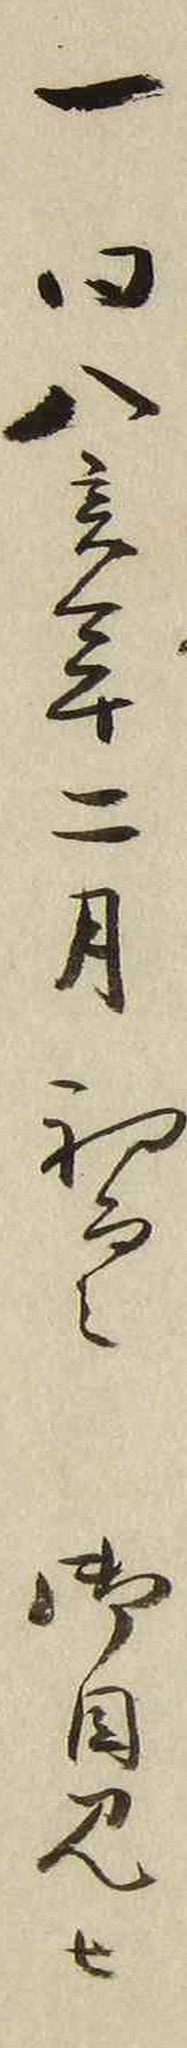一同八亥年二月初而之御目見

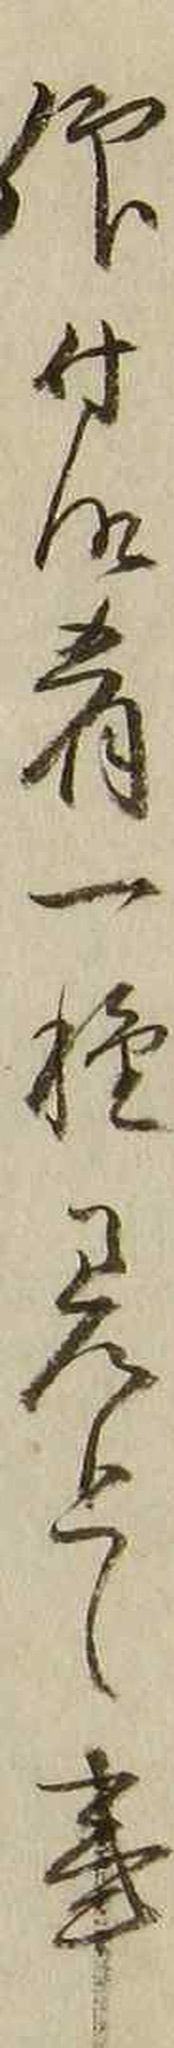押付御肴一種差上候事
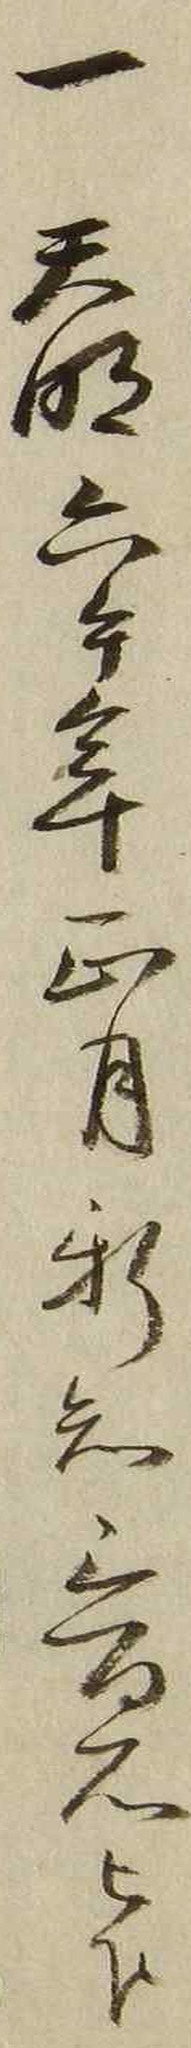一天明六午年正月新知三百石被下
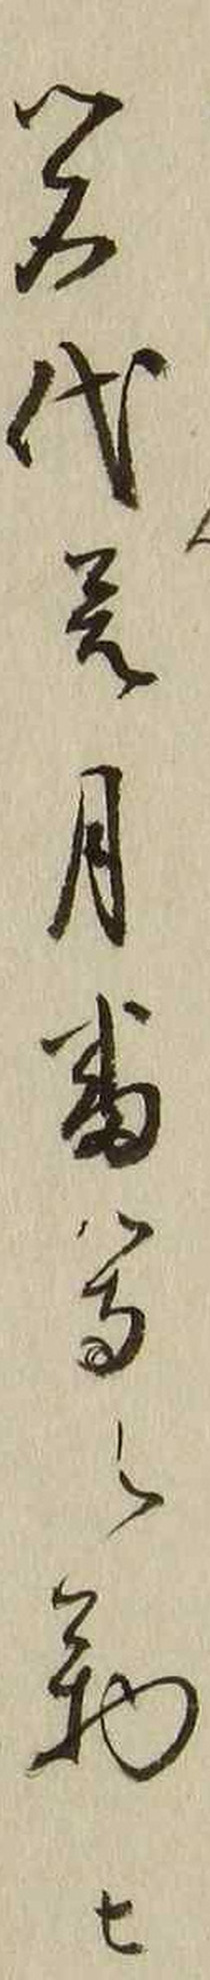等代并月番等之勤被
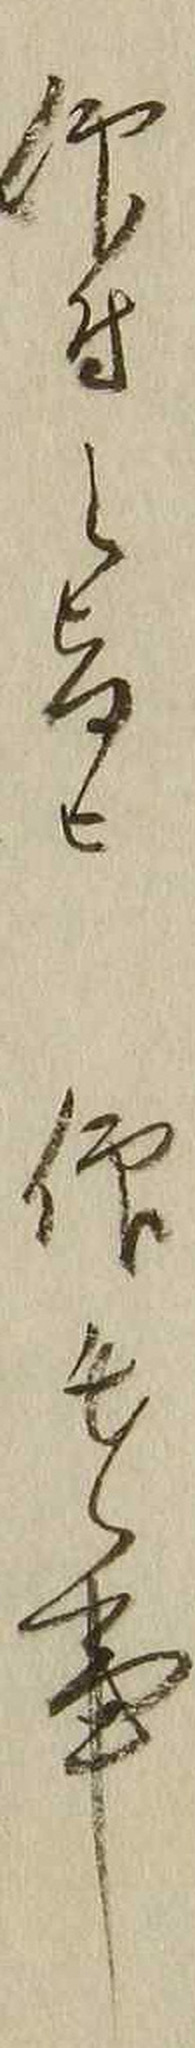仰付之旨被仰出候事
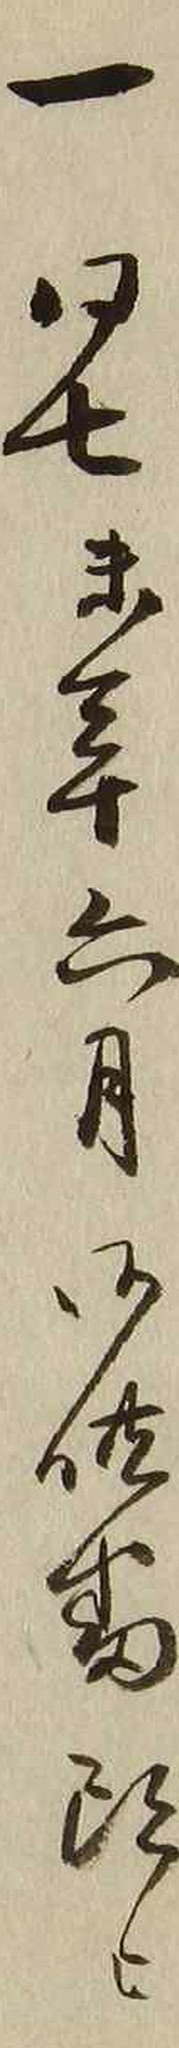一同七未年六月御供番頭被
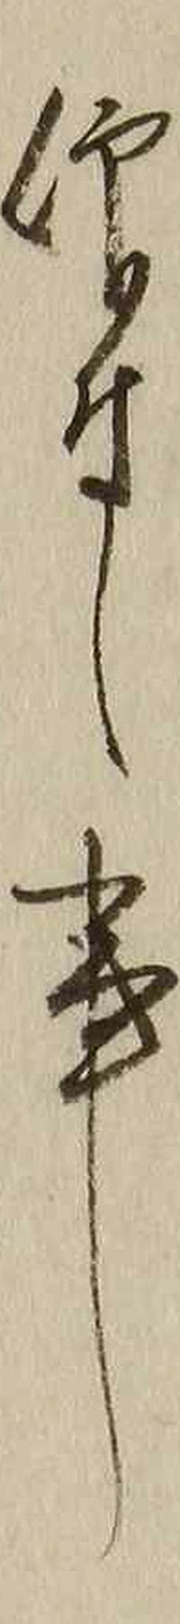仰付候事
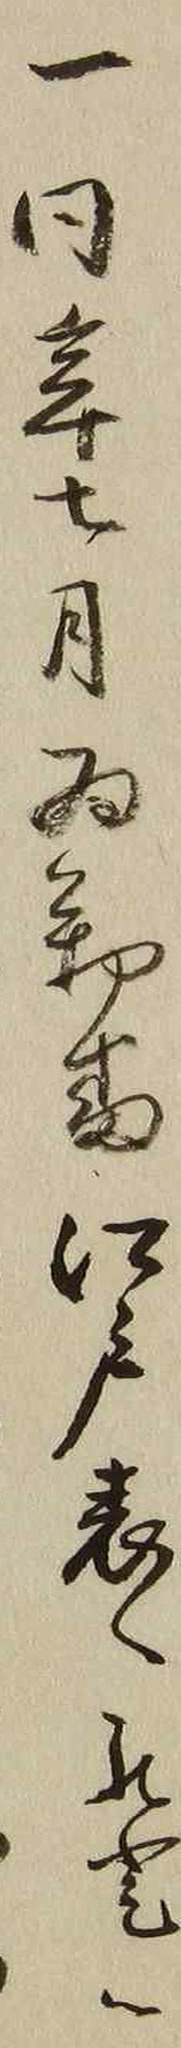一同年七月為勤番江戸表へ罷登候
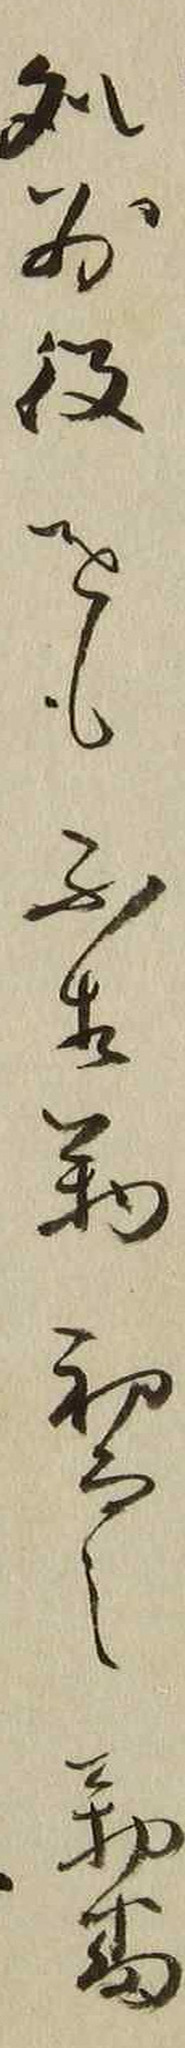処別役をも不相勤初而之勤番
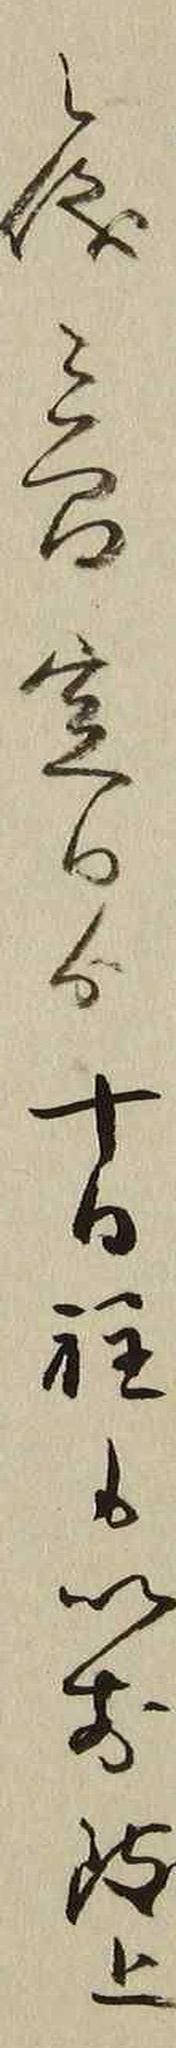之義に候間定日ゟ十日程も以前致上
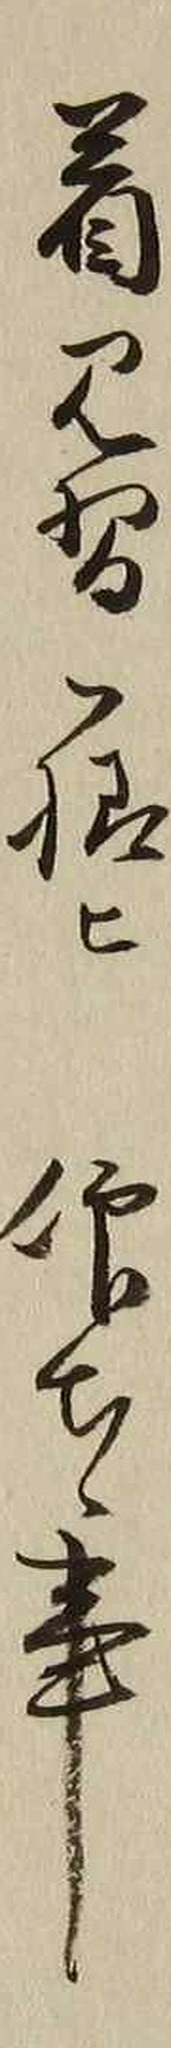着見習候様被仰出候事
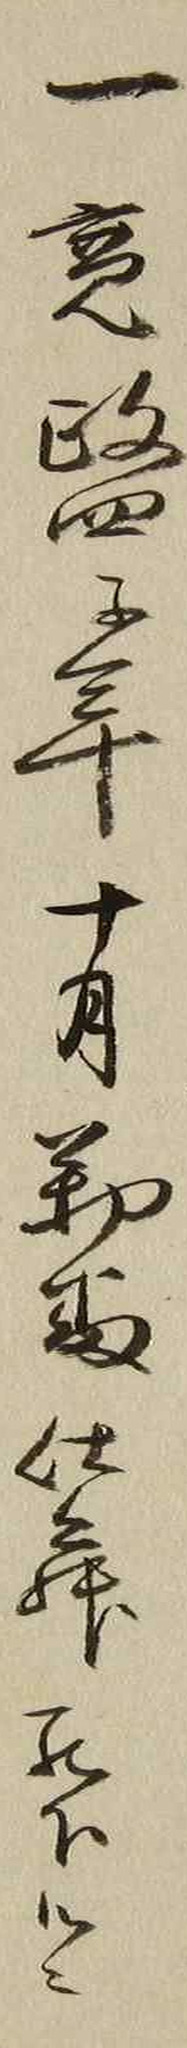一寛政四子年十月勤番仕舞罷下候に
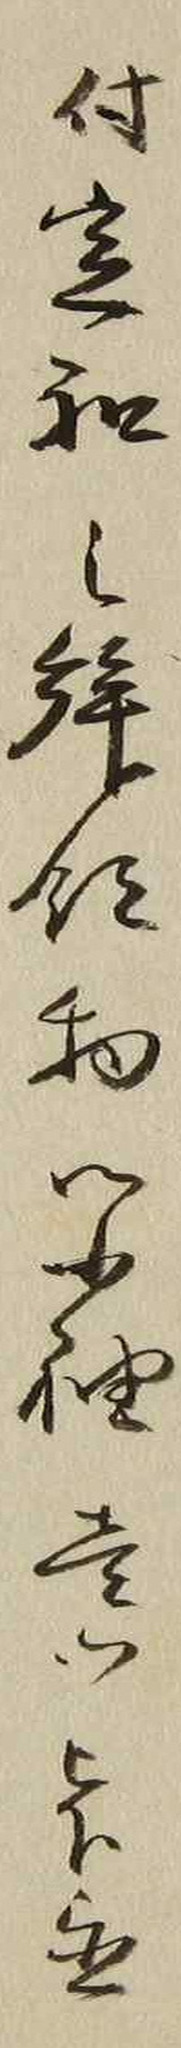付定和之拝領物御小袖壱つ被下置
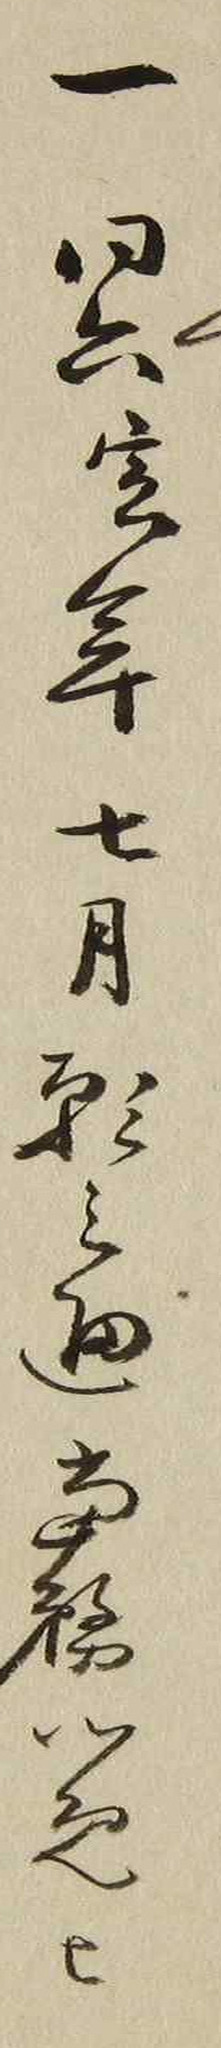一同六寅年七月願之通当務御免被
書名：諸士系譜　巻之292　き之部1
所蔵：会津若松市立会津図書館
